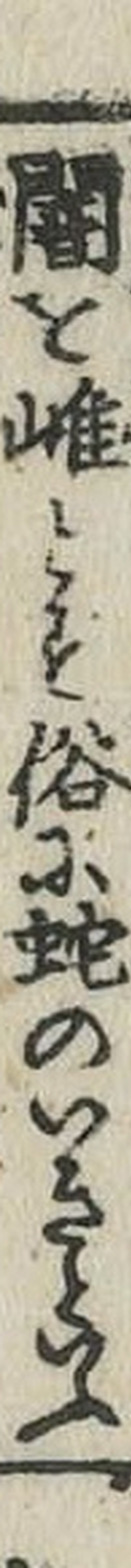闇を雌とす俗に蛇のいきといふ
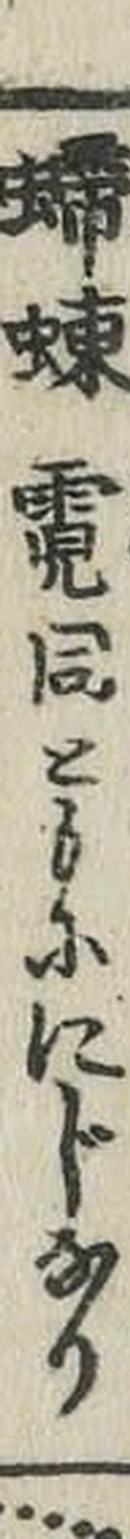螮蝀霓同ともににじなり
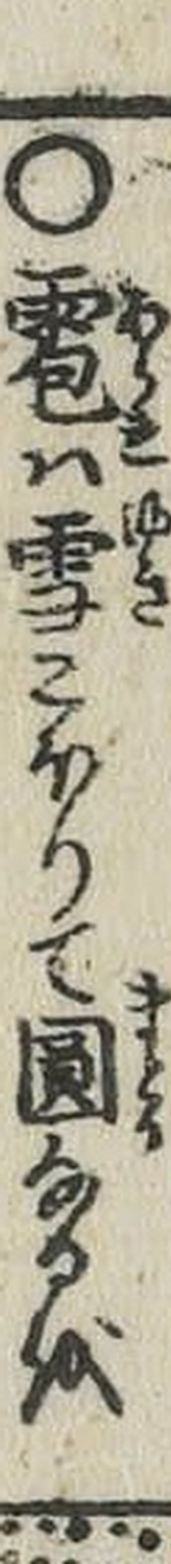○雹は雪こほりて円なるを
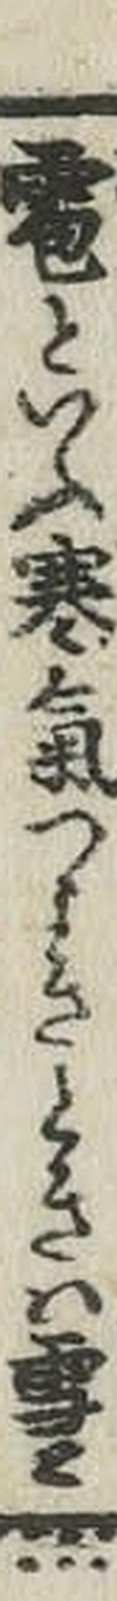雹といふ寒気つよきときは雪と
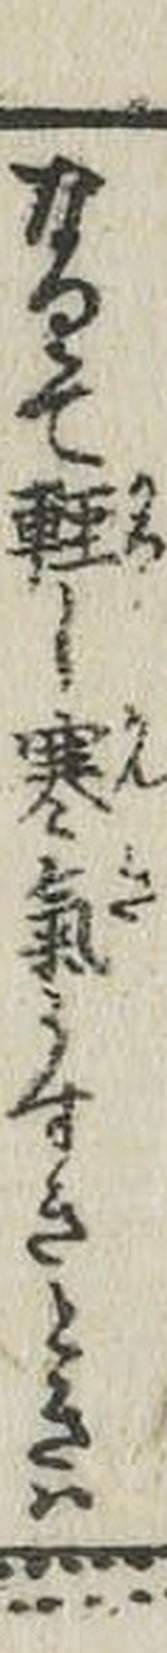なりて軽し寒気うすきときは
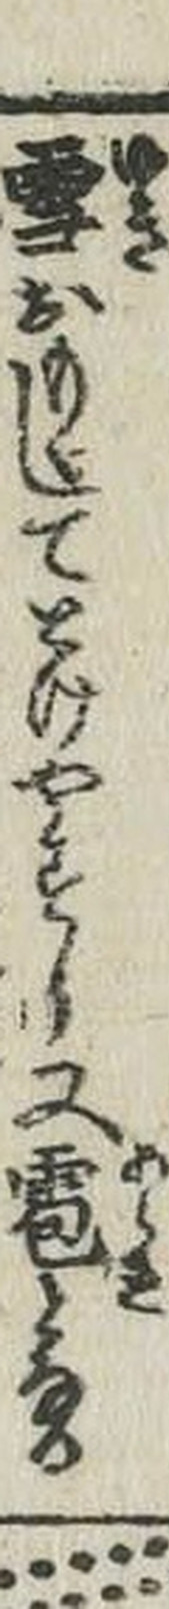雪おもくしてとけやすし又雹となる
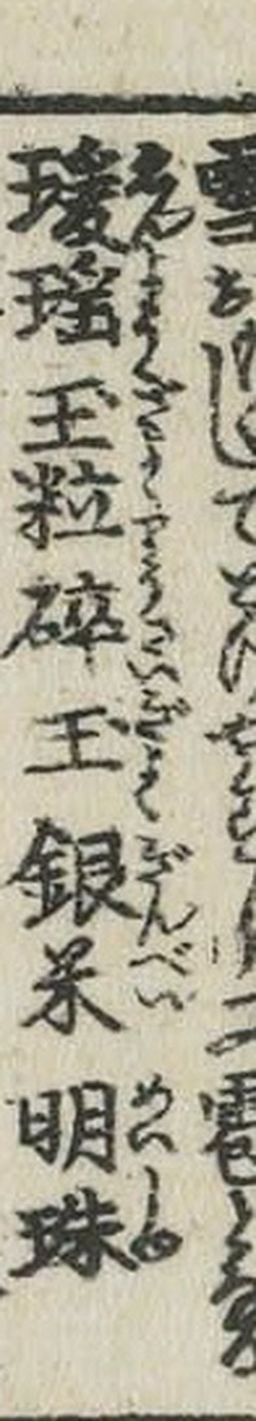瑗瑶玉粒砕玉銀米明珠
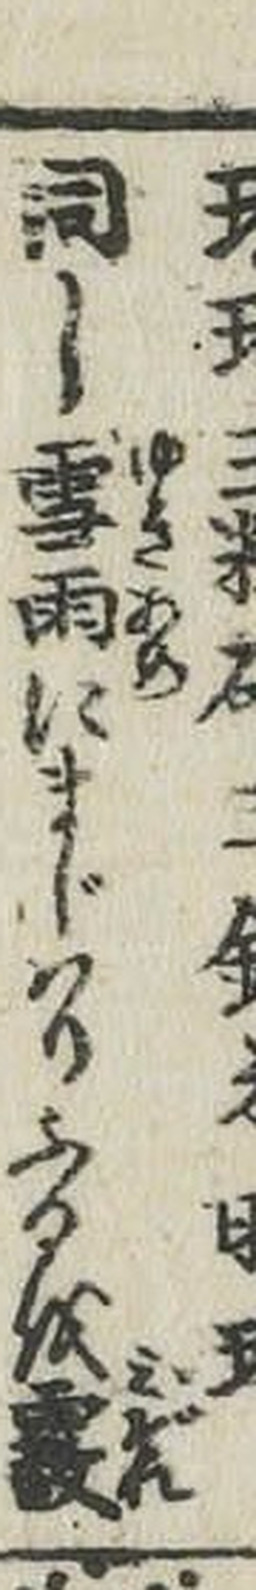同し雪雨にまじはりふるを霰
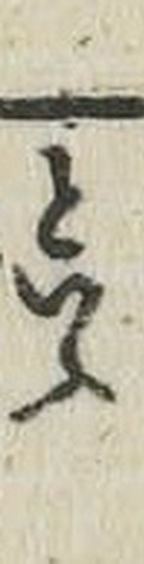といふ
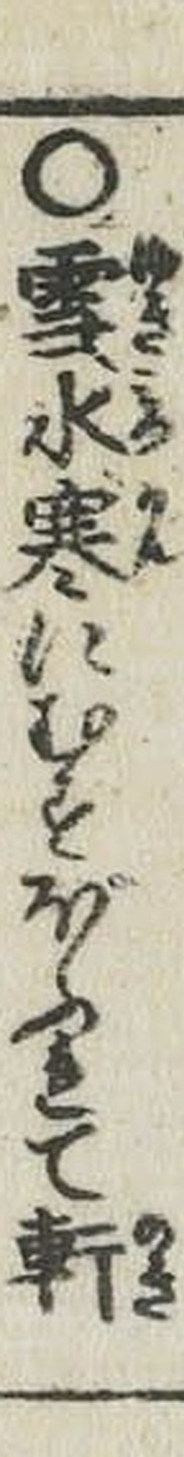○雪水寒にむすぼふれて軒
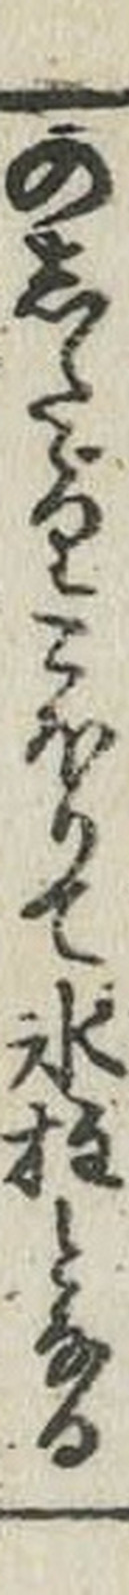のしたゞりこほりて氷柱となる
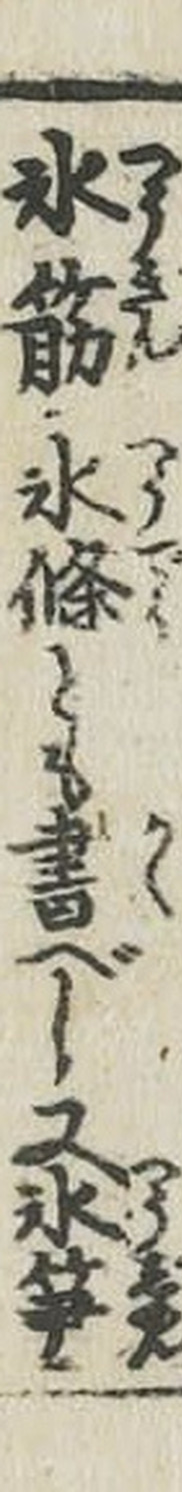氷筋氷条とも書べし又氷笋
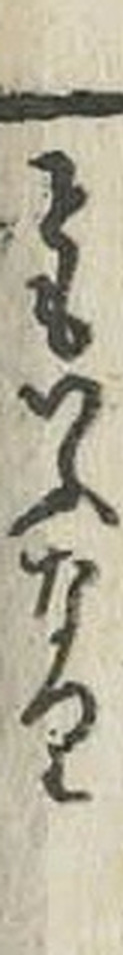ともいふなり
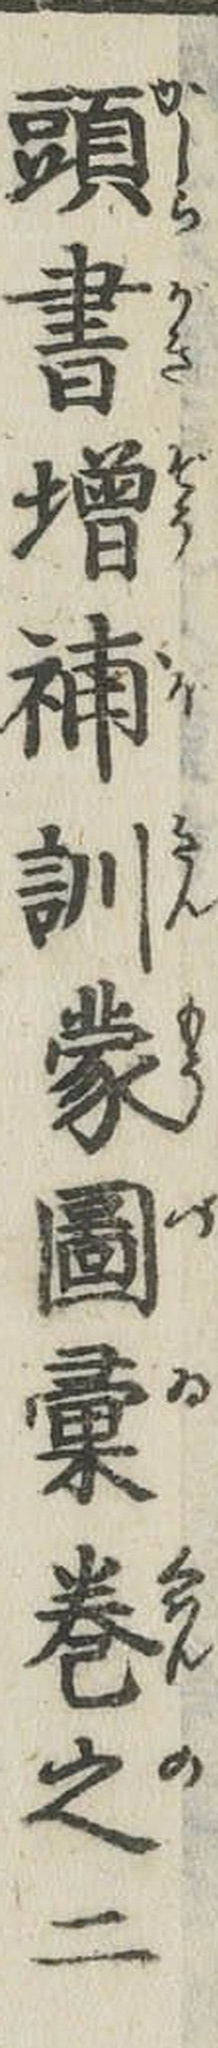頭書増補訓蒙図彙巻之二
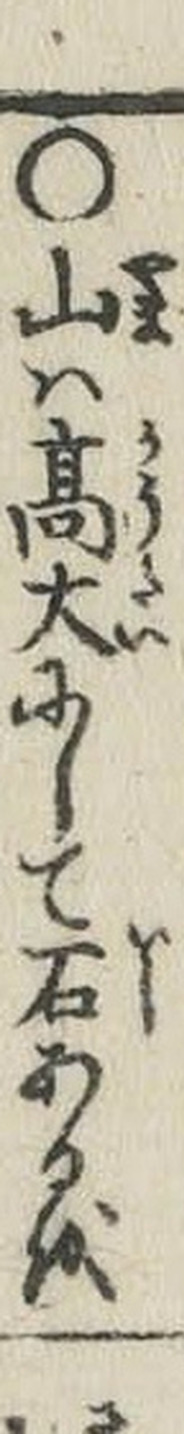○山は高大にして石あるを
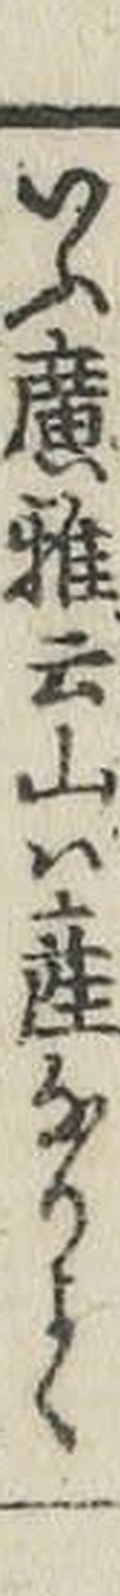いふ広雅云山は産なりよく
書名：増補頭書訓蒙図彙大成 10巻 2:巻之1-3
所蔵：東京学芸大学教育コンテンツアーカイブ
